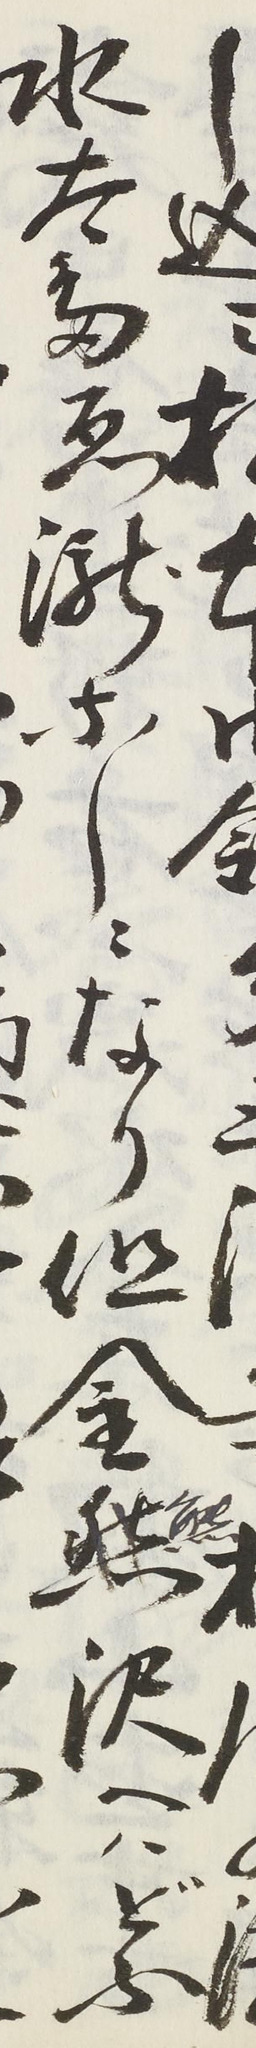水たたゑ瀧なし二なり但金熊沢へハどふ
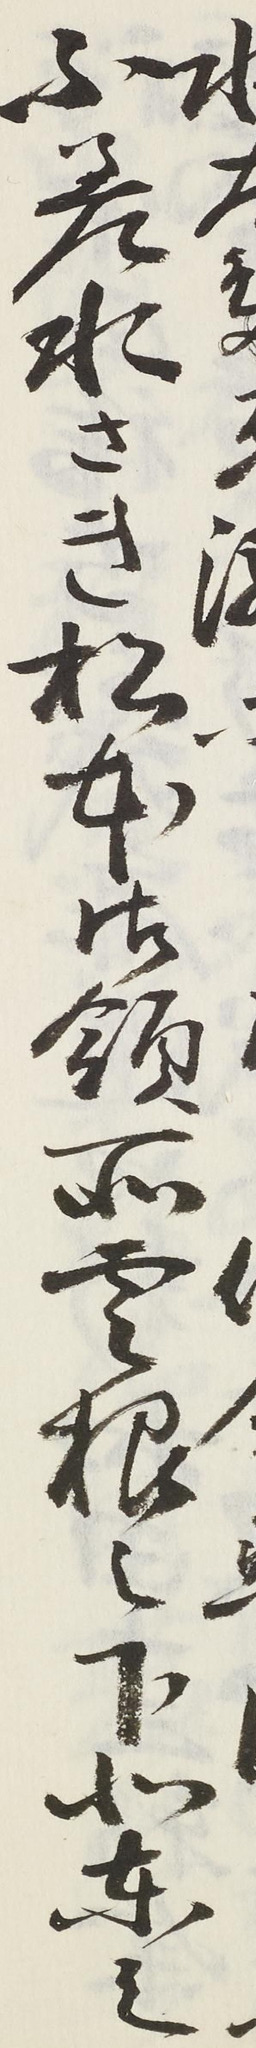不差水さき松本御領所雪根之下北東之
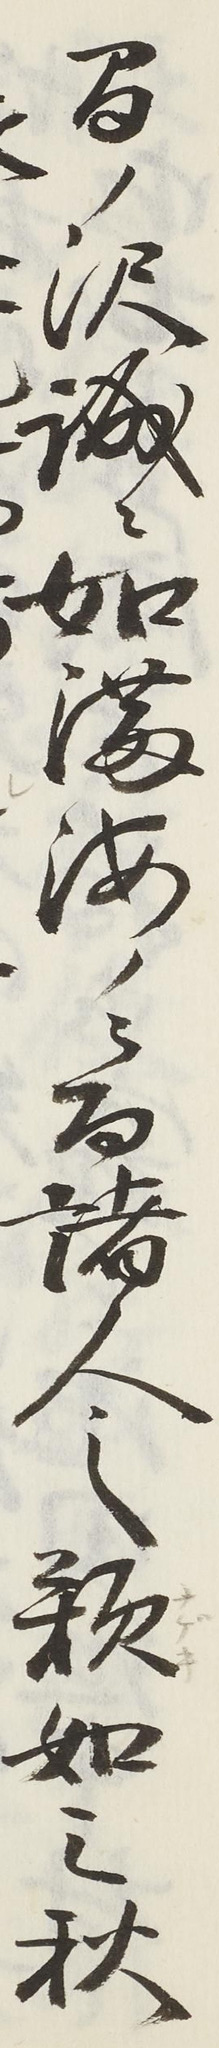間ノ沢誠二如満海ノ二而諸人之歎如之秋
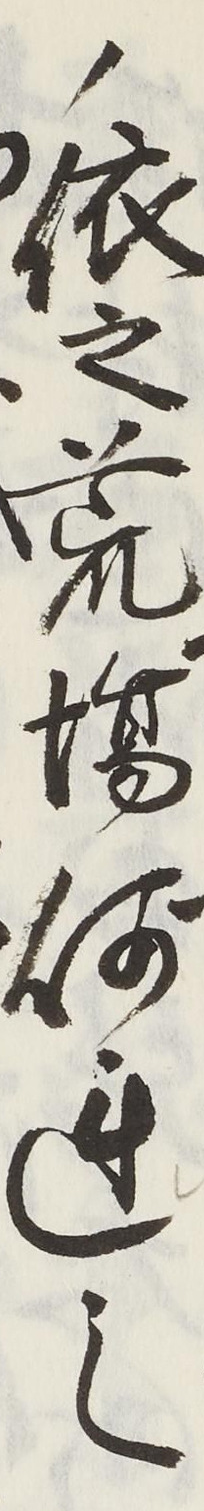ノ依之荒場何れ之
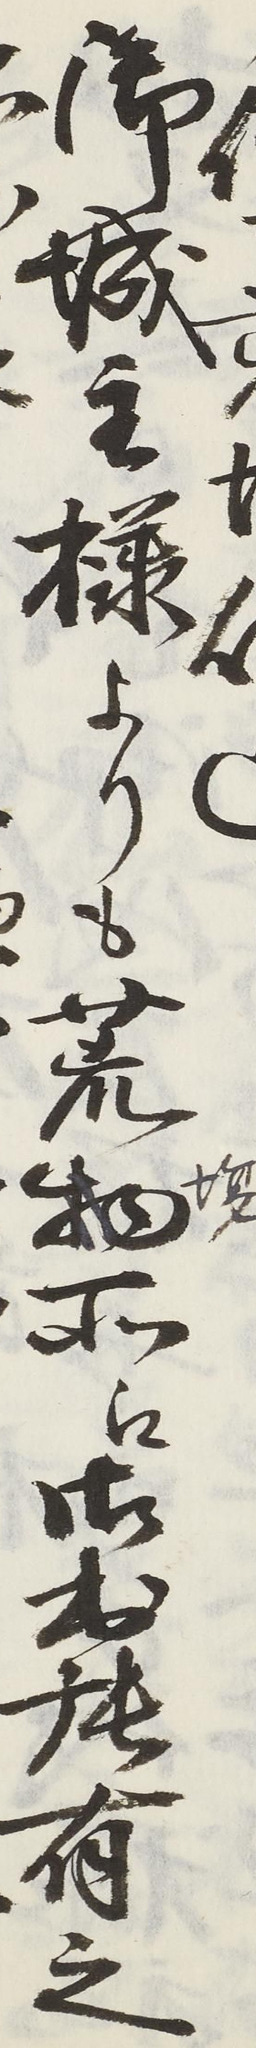御城主様よりも荒場所江御出張有之
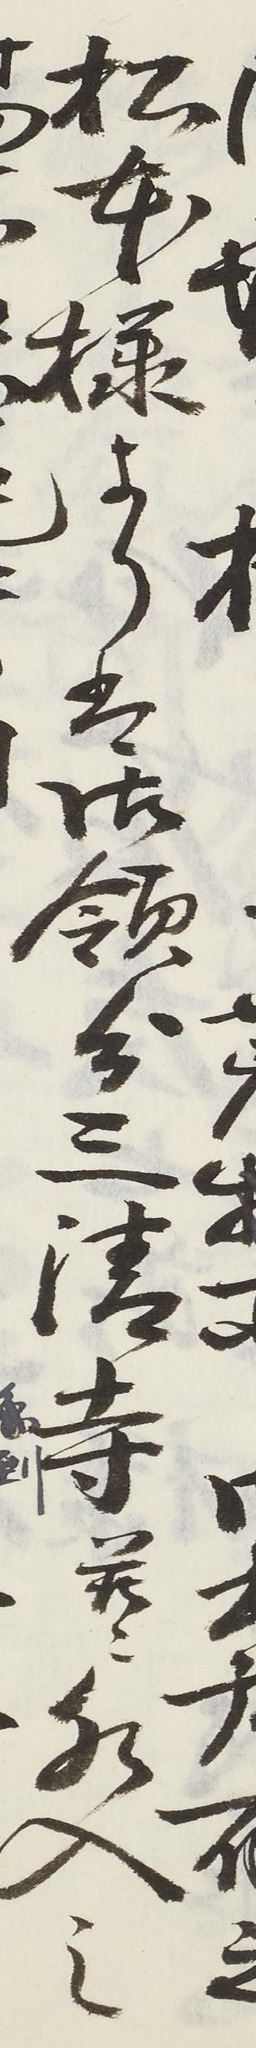松本様よりは御領分三清寺并二水入之
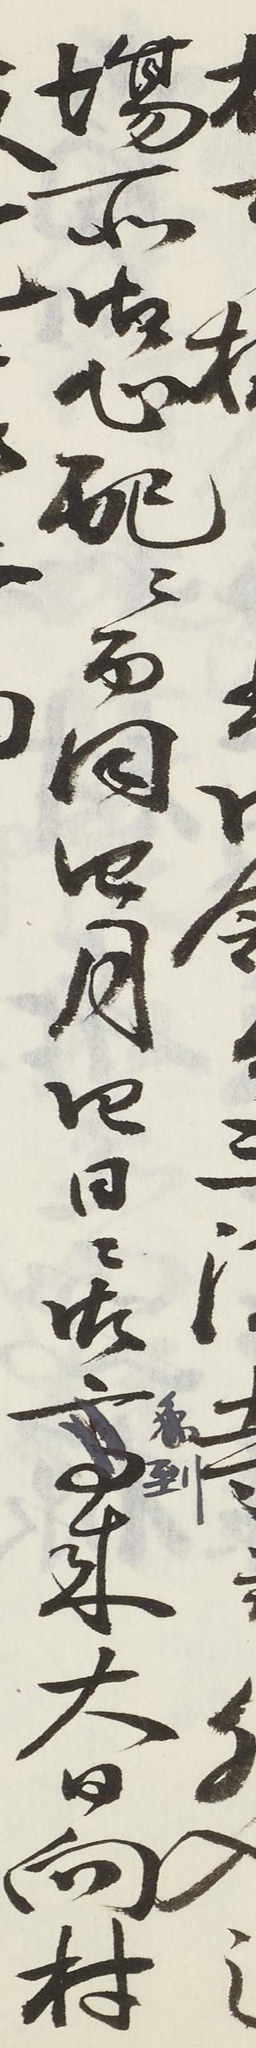場所御心配二而同四月四日二御到來大日向村
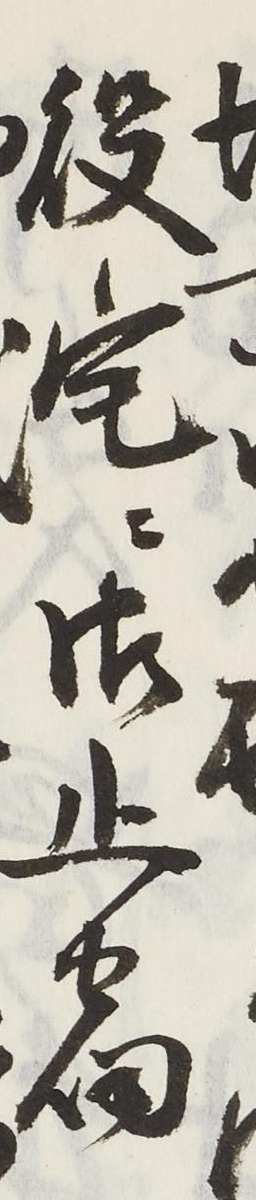役宅二御止宿
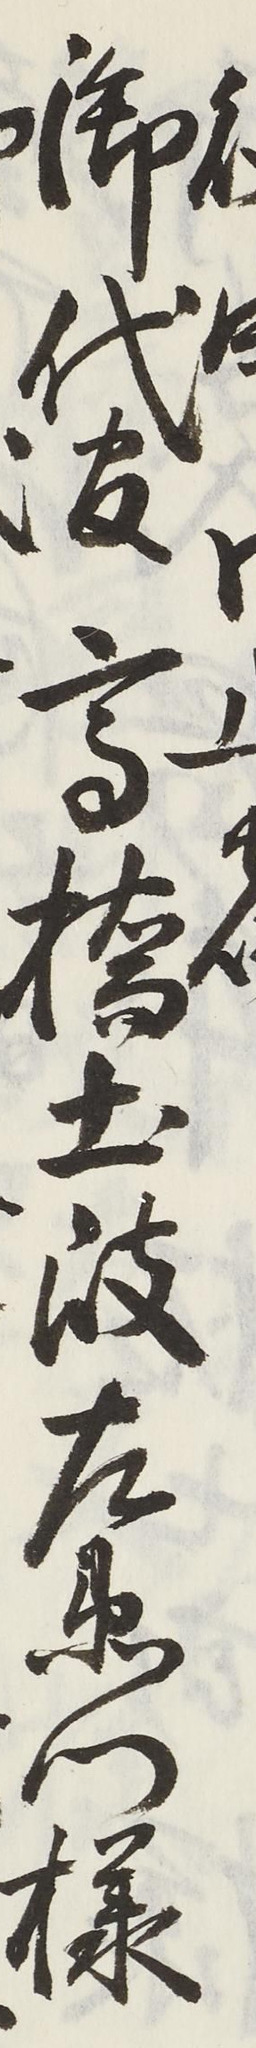御代官高橋土岐左衛門様
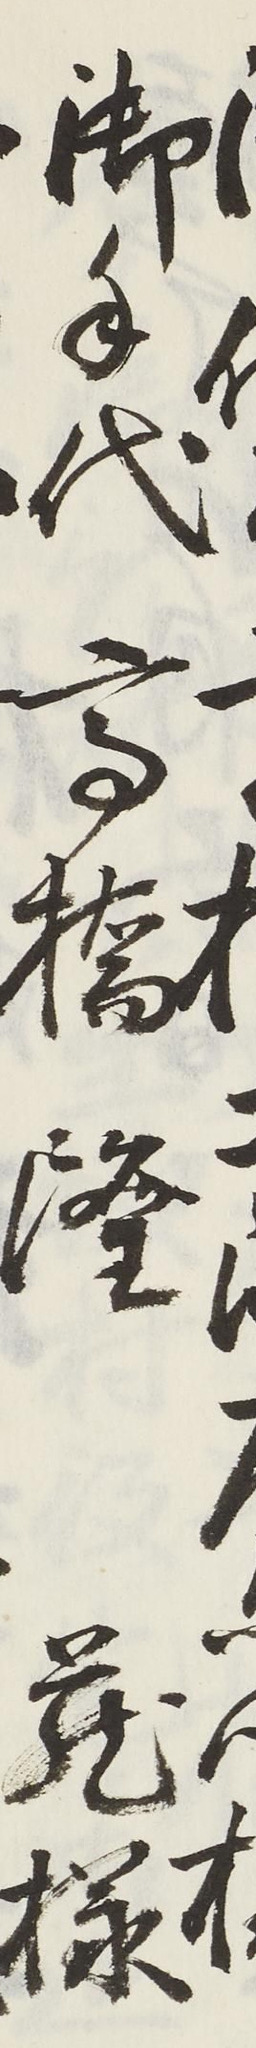御手代高橋隆蔵様
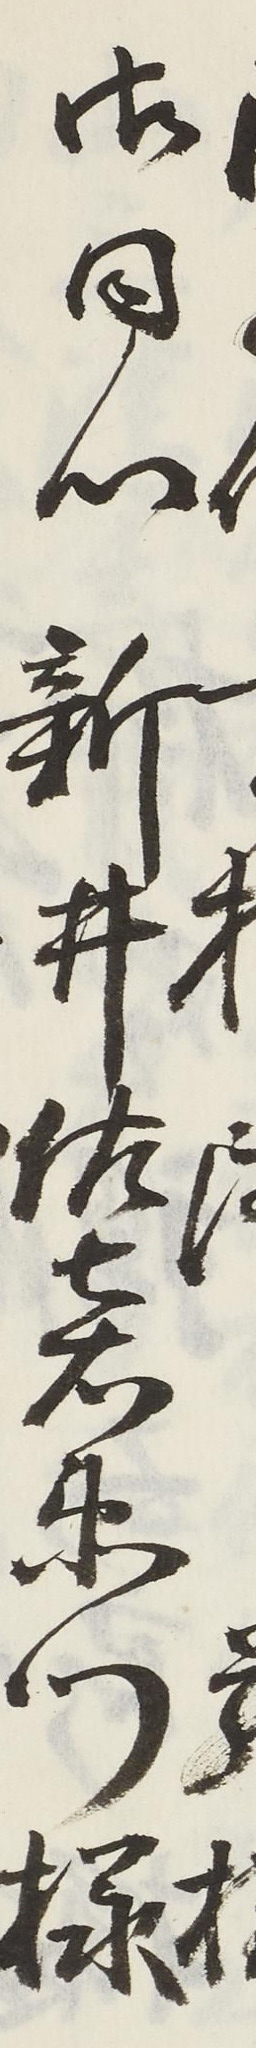御同心新井佐七右衛門様
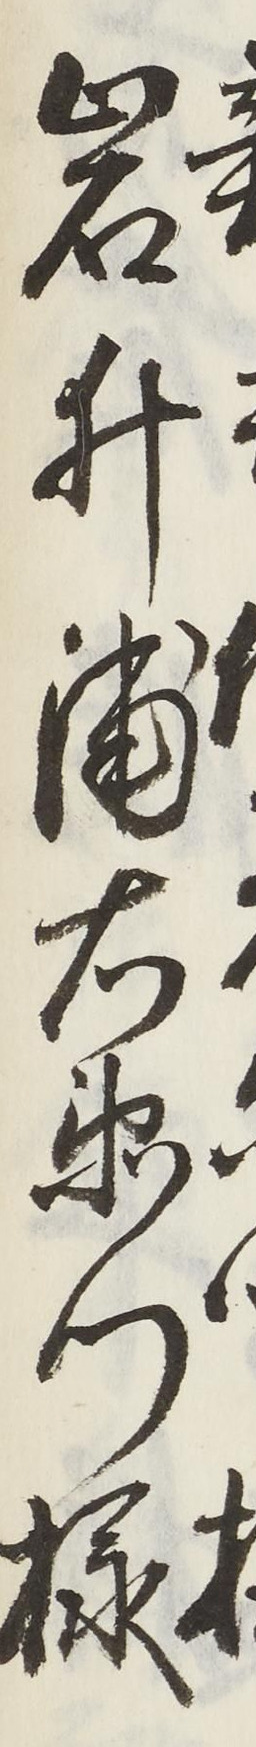岩井浦右衛門様

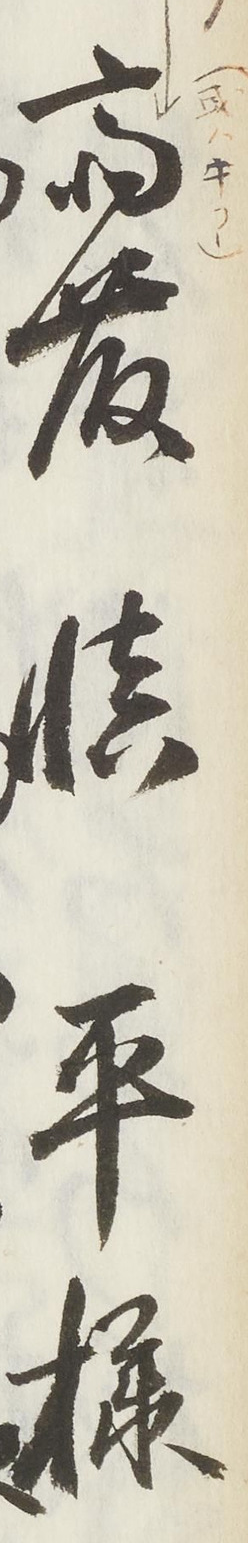高藤慎平様
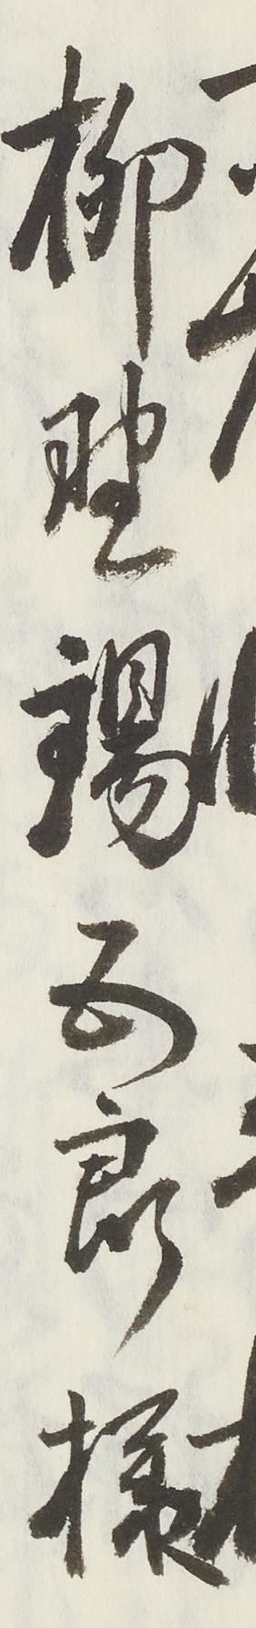柳野錫五郎様
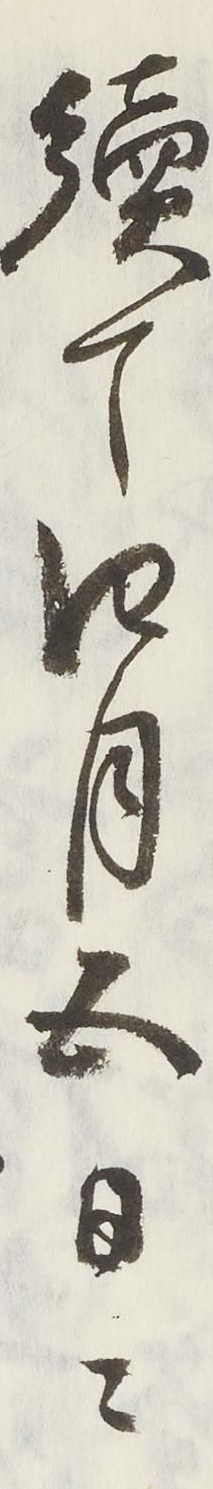続て四月五日二
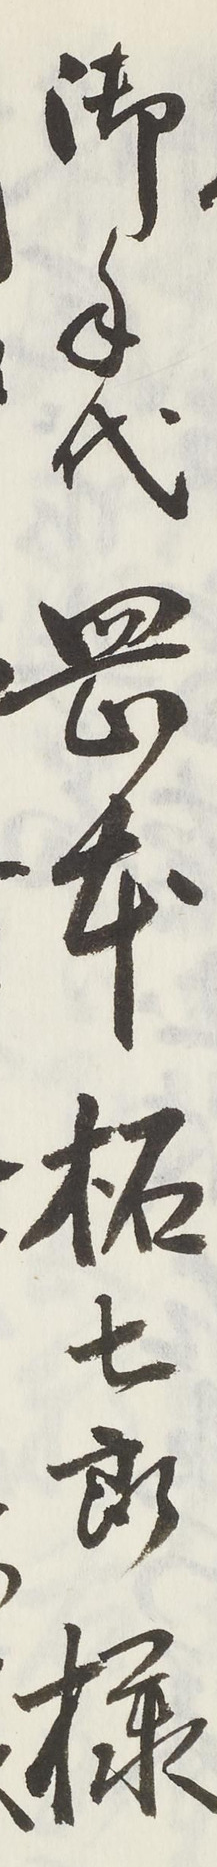御手代岡本柘七郎様
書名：弘化四年地震記
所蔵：東京大学地震研究所図書室 Earthquake Research Institute Library, The University of Tokyo, JAPAN
